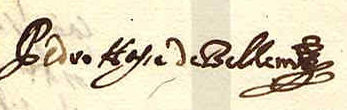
Pedro Hasse de Bellem
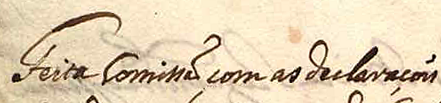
Feita Comissaõ, com as declarações
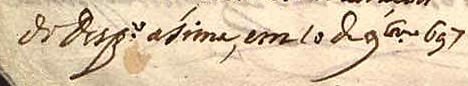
do Desp.o asima, em 10 de 9.bro 697
